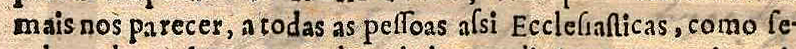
mais nos parecer, a todas as pessoas assi Ecclesiasticas, como se
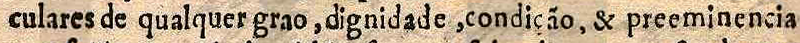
culares de qualquer grao, dignidade, condição, & preeminencia
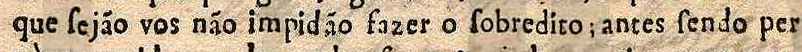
que sejão vos não impidão fazer o sobredito; antes sendo per
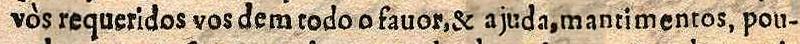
vòs requeridos vos dem todo o fauor, & ajuda, mantimentos, pou
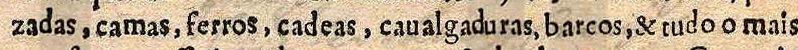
zadas, camas, ferros, cadeas, caualgaduras, barcos, & tudo o mais
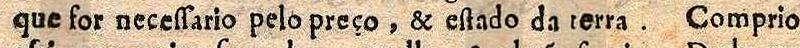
que for necessario pelo preço, & estado da terra. Comprio
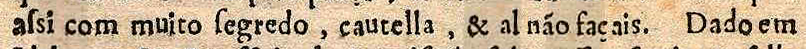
assi com muito segredo, cautella, & al não façais. Dado em
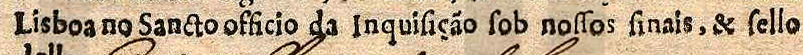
Lisboa no Sancto officio da Inquisição sob nossos sinais, & sello
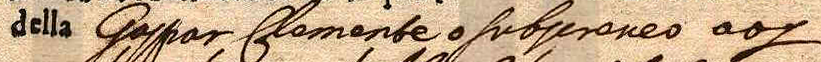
della Gaspar Clemente o subscreueo aos
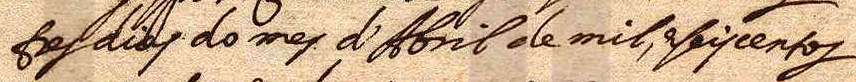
tres dias do mes d'Abril de mil, E seiscentos
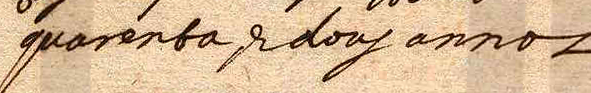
quarenta, E dous annos
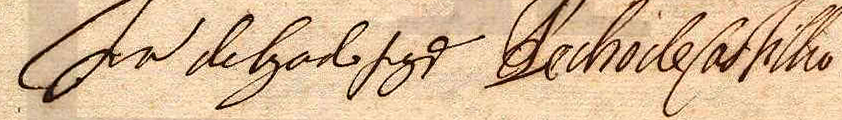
Joā delgado figr̄ Pedro de Castilho
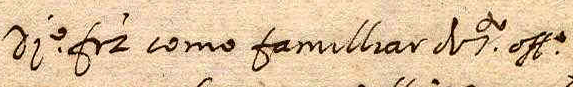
dj.o frz̄ como familliar do s.to off.o
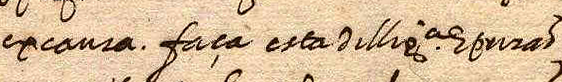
ex cauza. faça esta dillig.a E prizaõ
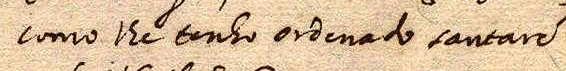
como lhe tenho ordenado santarē
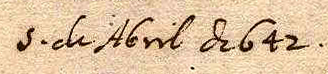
5. de Abril de 642.
